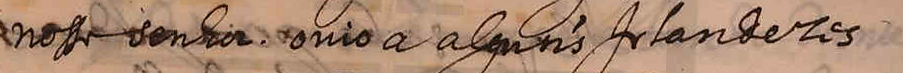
nosso senhor. ouio a alguns̄ Jrlandezes
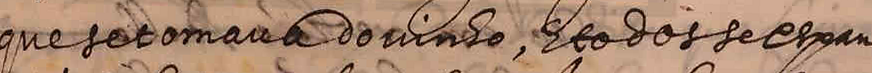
que se tomaua do uinho, E todos se espan
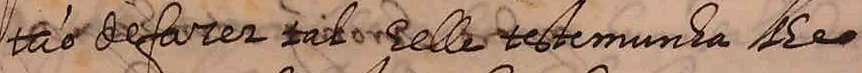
taõ de fazer tal E elle testemunha lhe
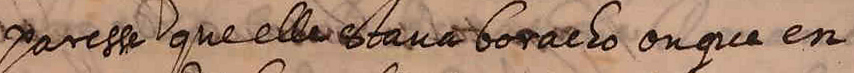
paresse que elle estaua boracho ou que en
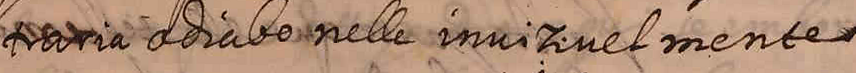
traria o diabo nelle inuiziuelmente
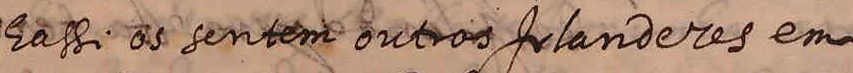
E assi os sentem outros Jrlandezes em
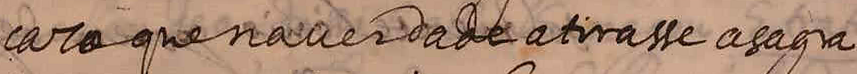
cazo que na uerdade atirasse a sagra
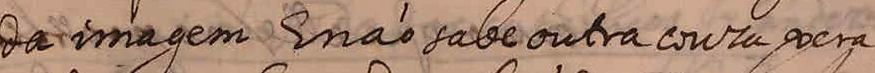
da imagem E naõ sabe outra couza pera
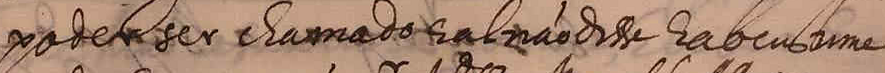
poder ser chamado E al naõ disse E ao custume
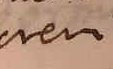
creui
